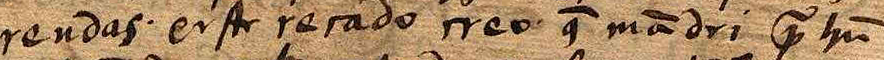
rendas. e este recado creo q̄ mādei p̄o hū
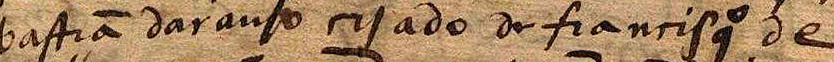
bastiā darauJo crjado de francisqo de
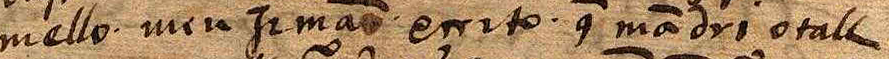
mello. meu Jrmão e certo q̄ mādei o tall
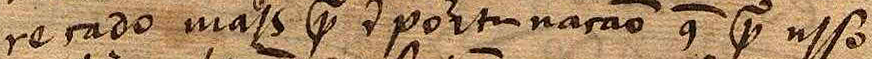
recado majs p̄ ēportunação q̄ p̄o nJso
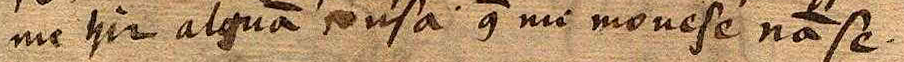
me hir alguā cousa q̄ me mouese nā se
